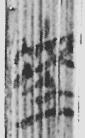𫊟（吾）
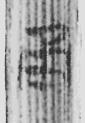甬
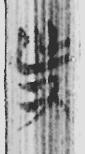拃（作）
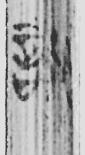{言比}（僻）
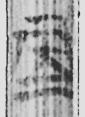再
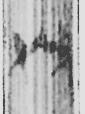夂
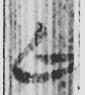㠯（以）
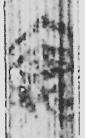寓
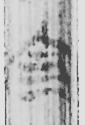命
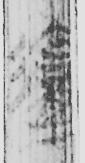達
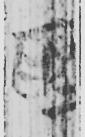聖
